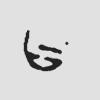曰
